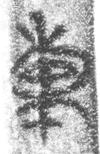橐
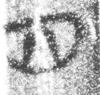四
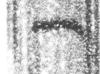一
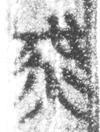○（滅）
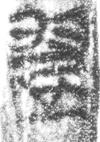盟
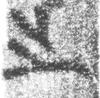之
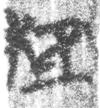柜
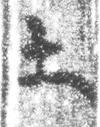土
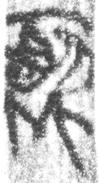螻
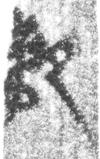厀（漆）
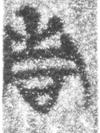青
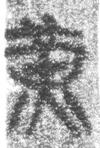黃
